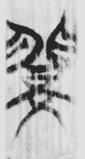閺
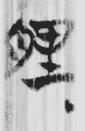{月里}
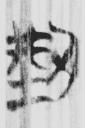型
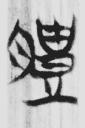{肉豊}
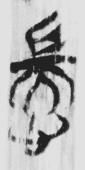惴
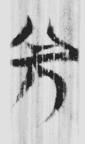{八万}
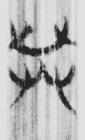共
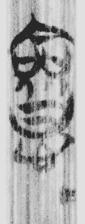憸
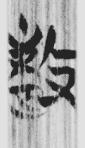整
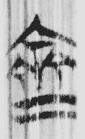齊
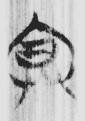弇
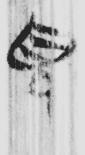見
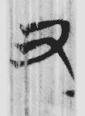又
